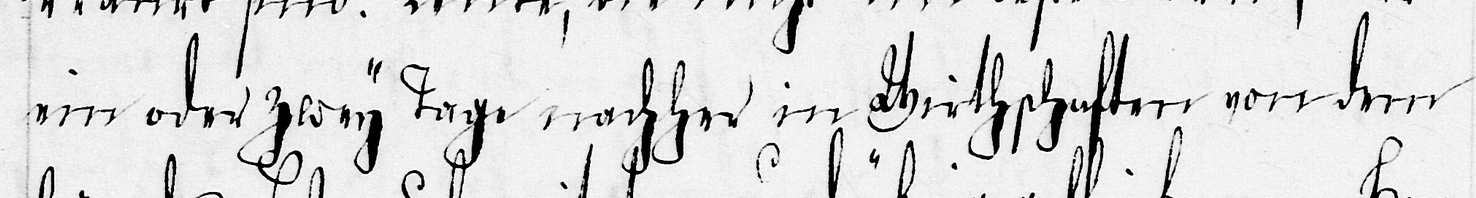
ein oder zwey Tage nachher in Wirthschaften von dem
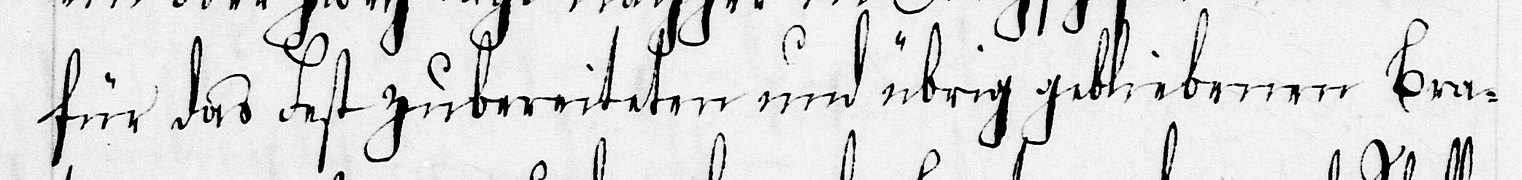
für das Fest zubereiteten und übrig gebliebenen Bra¬
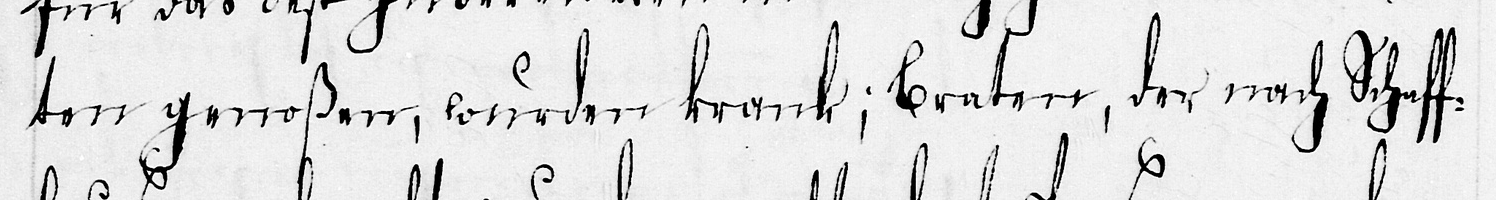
ten genoßen, wurden krank; Braten, der nach Schaf¬
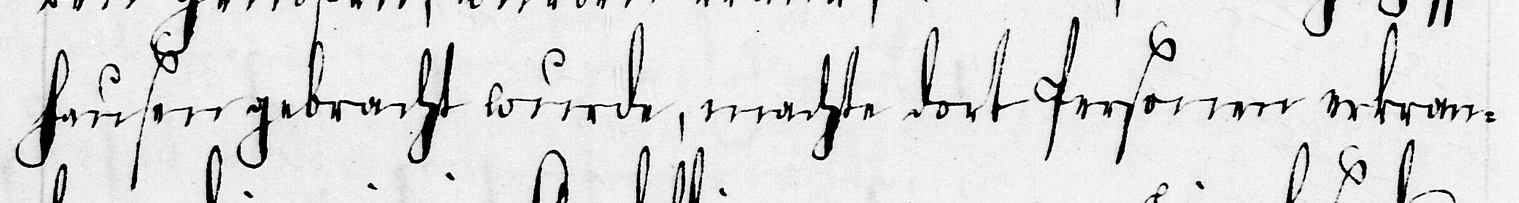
fhausen gebracht wurde, machte dort Personen erkran¬
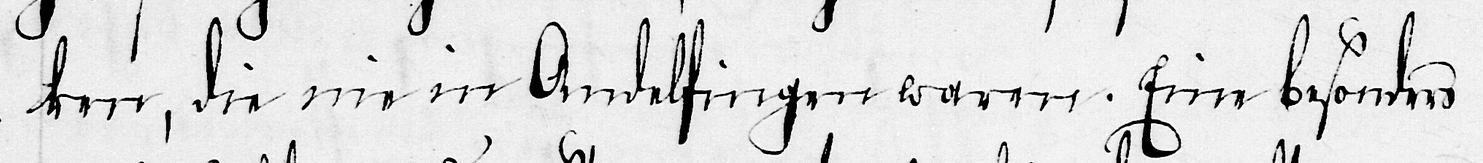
ken, die nie in Andelfingen waren. Eine besonders
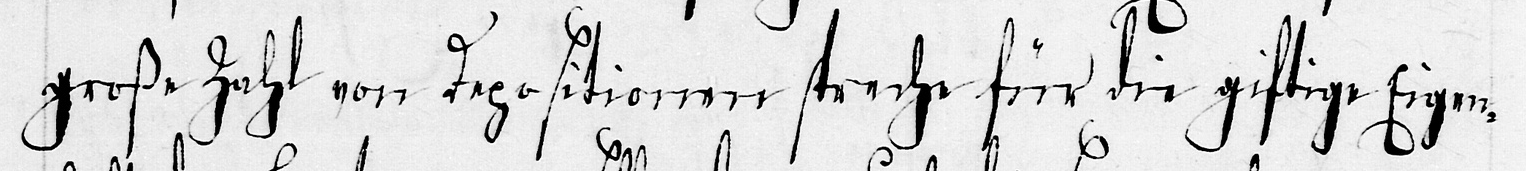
große Zahl von Depositionen spreche für die giftige Eigen¬
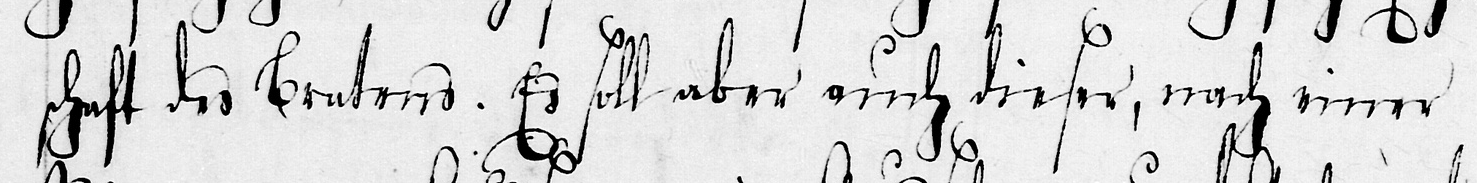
schaft des Bratens. Es soll aber auch dieser, nach einer
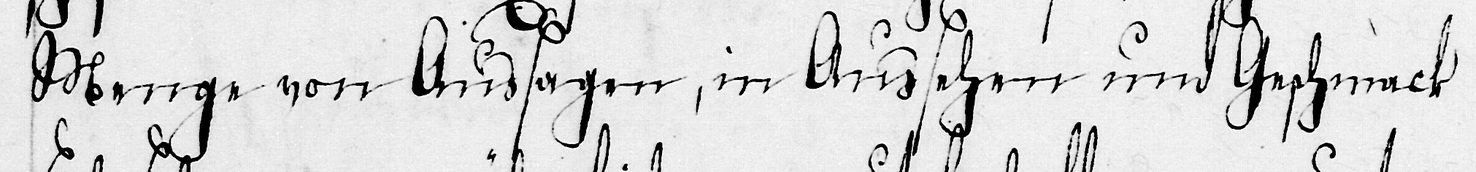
Menge von Aussagen, in Aussehen und Geschmack
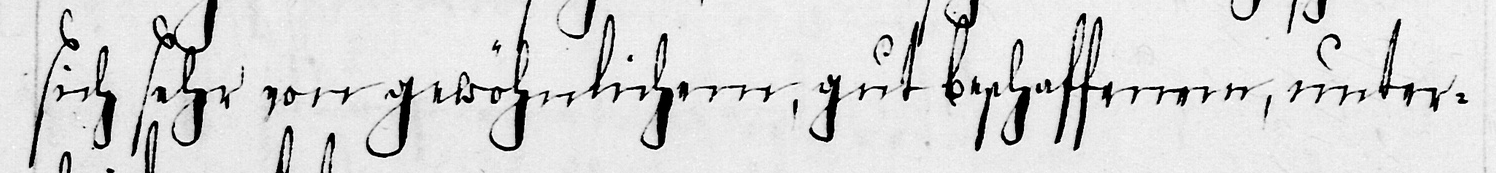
sich sehr von gewöhnlichem, gut beschaffenem, unter¬
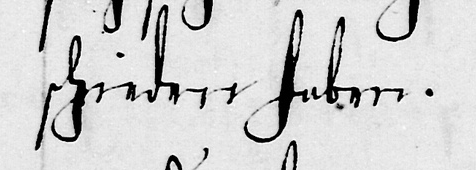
schieden haben.
